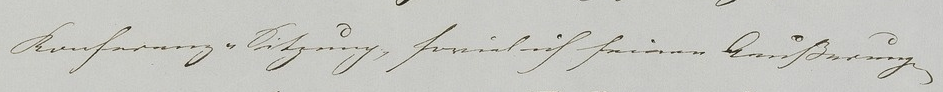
Konferenz-Sitzung, soviel ich seinen Äußerungen
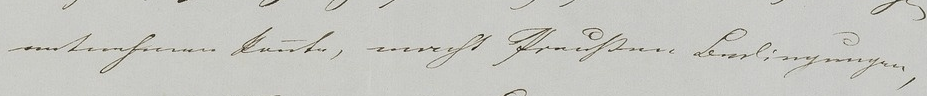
entnehmen konnte, macht Preußen Bedingungen,
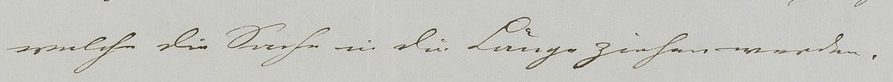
welche die Sache in die Länge ziehen werden.
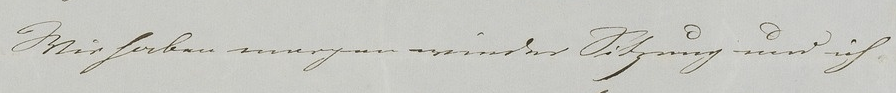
Wir haben morgen wieder Sitzung und ich
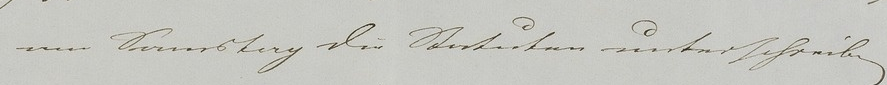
am Samstag die Statuten unterschreiben
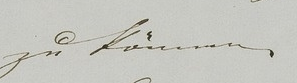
zu können.
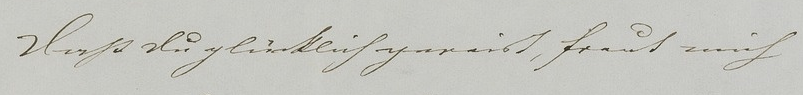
Daß Du glücklich gereist, freut mich
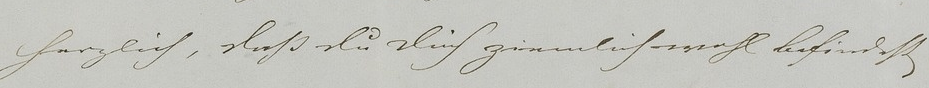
herzlich, daß du Dich ziemlich wohl befindest
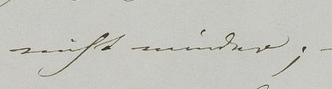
nicht minder;
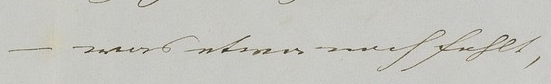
– was etwa noch fehlt,
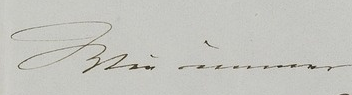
Wie immer
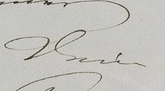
Dein
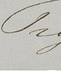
Paris,
